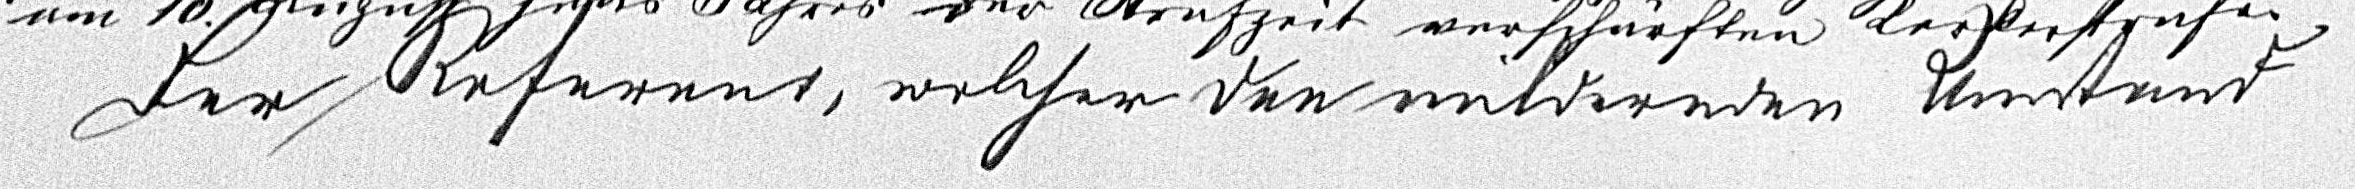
Der Referent, welcher den mildernden Umstand
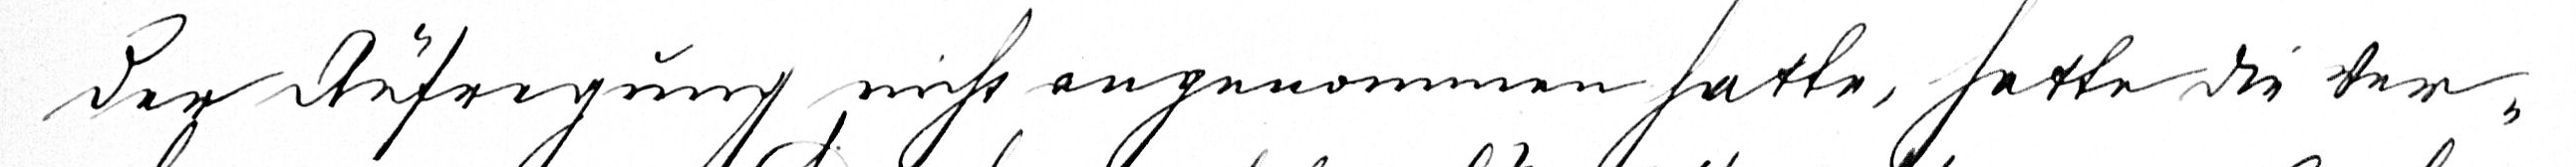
der Aufregung nicht angenommen hatte, hatte die Ver¬
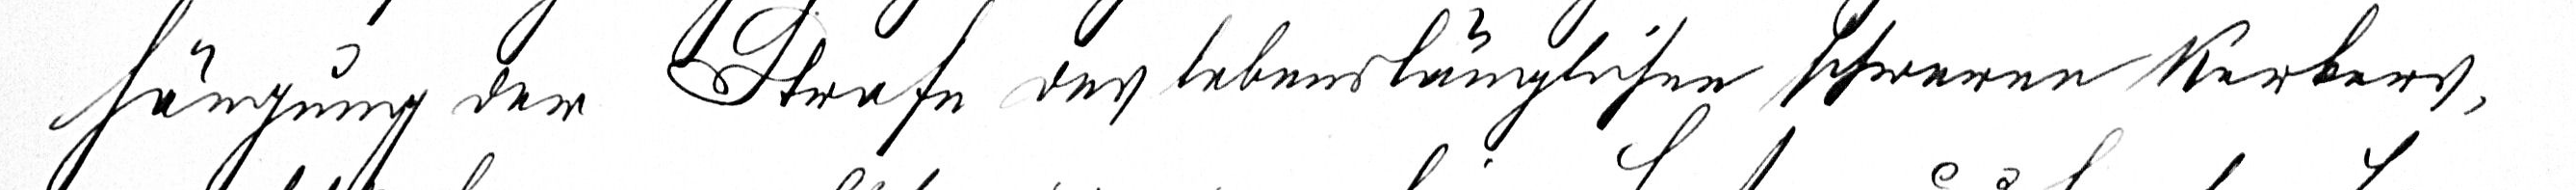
hängung der Strafe des lebenslänglichen schweren Kerkers¬
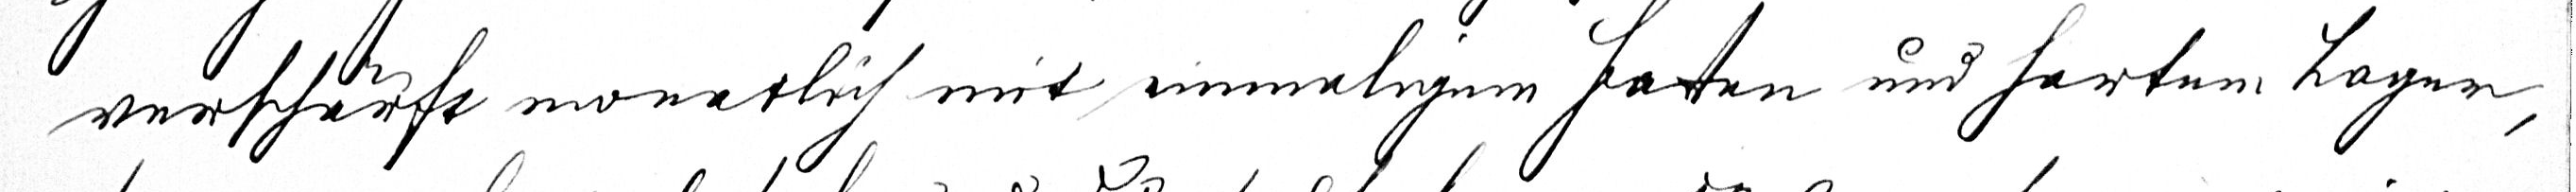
verschärft monatlich mit einmaligen Staxxen und hartem Lager,
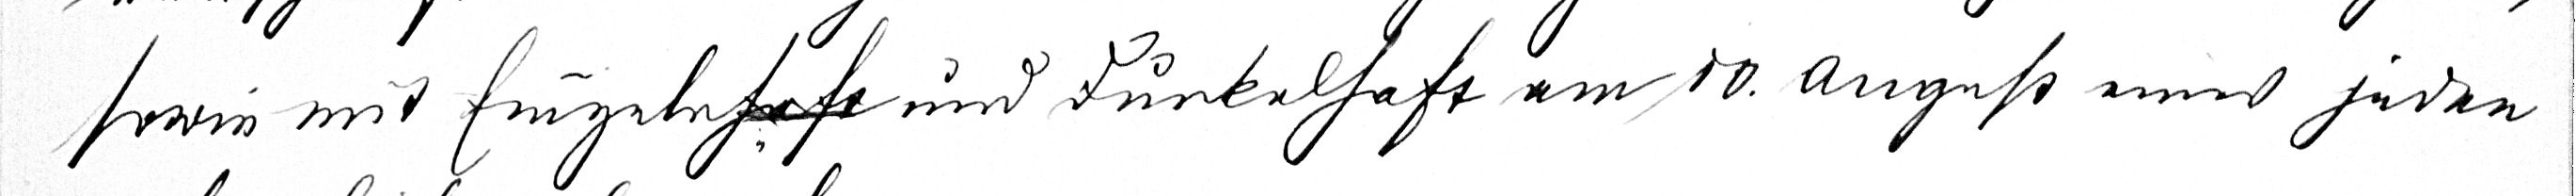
sowie mit Einzeln und Funkelhaft am 10. August ?? jeden
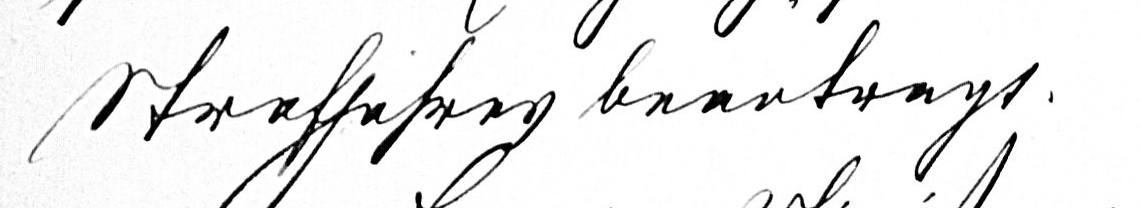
Strafjahres beantragt.
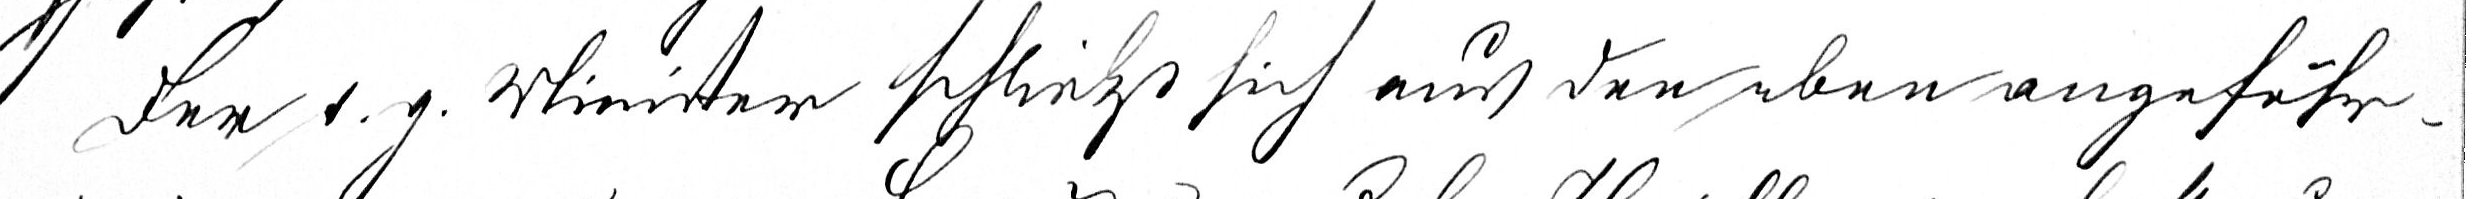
Der xx. g. Minister schließt sich aus den eben angeführ¬
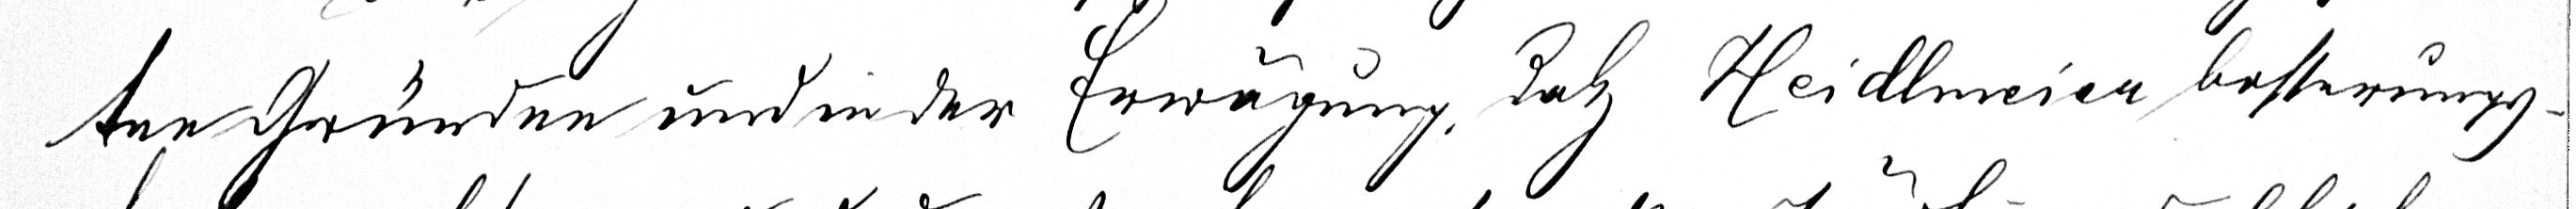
ten Gründen und in der Erwägung, daß Heidlmeier besserungs¬
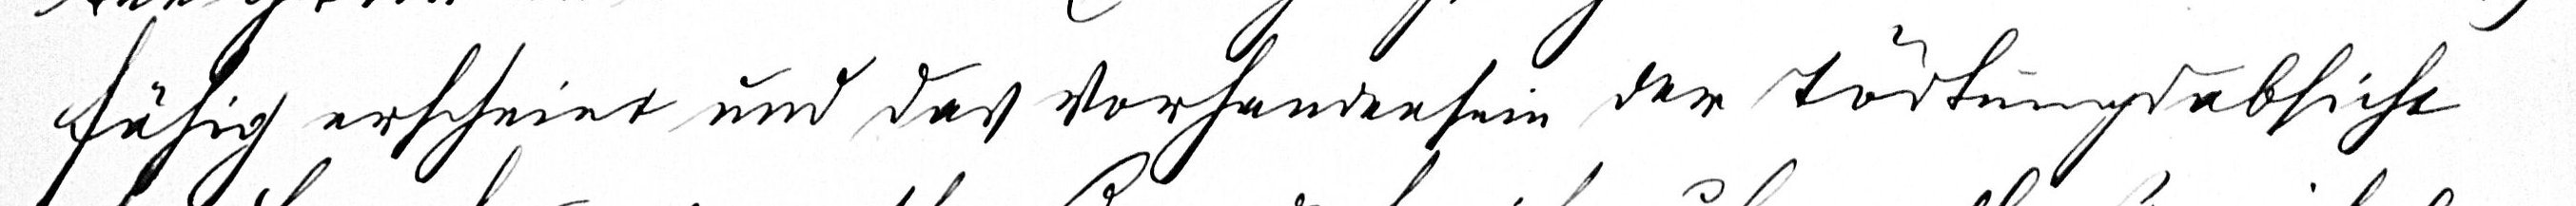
fähig erscheiet und das Vorhandensein der Tödtungsabsicht
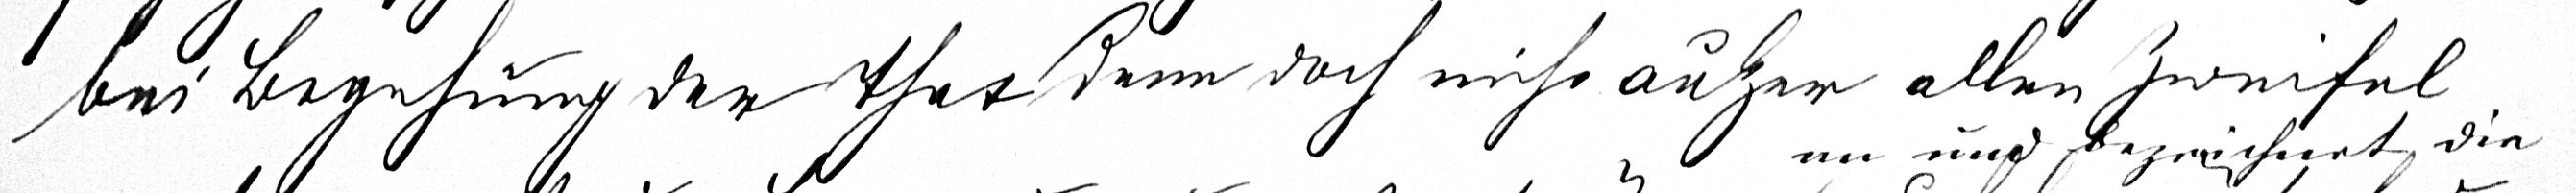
bei Begehung der That denn doch nicht außer allen Zweifel
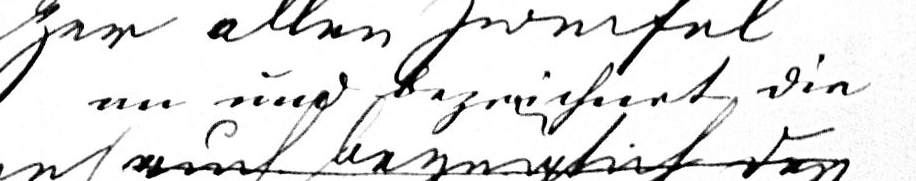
an und bezeichnet die
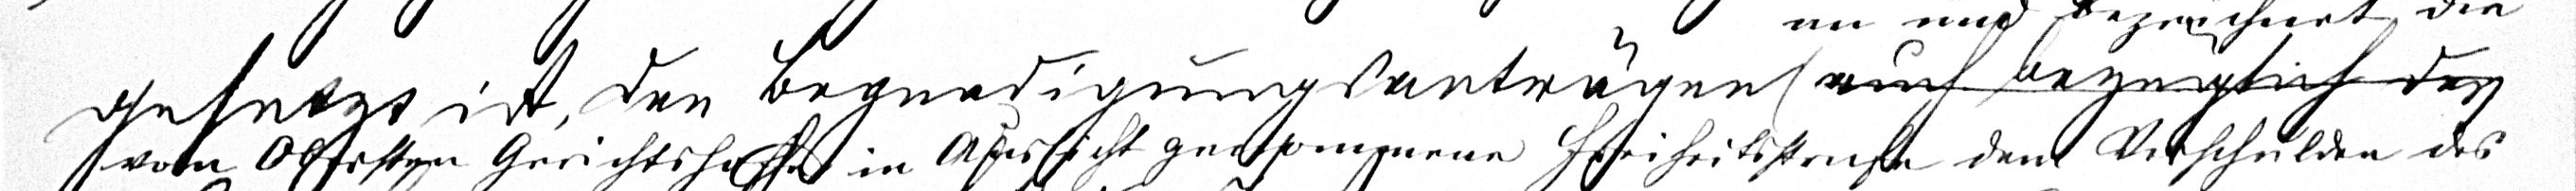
gesetzt ist, den Begnadigungsantragen
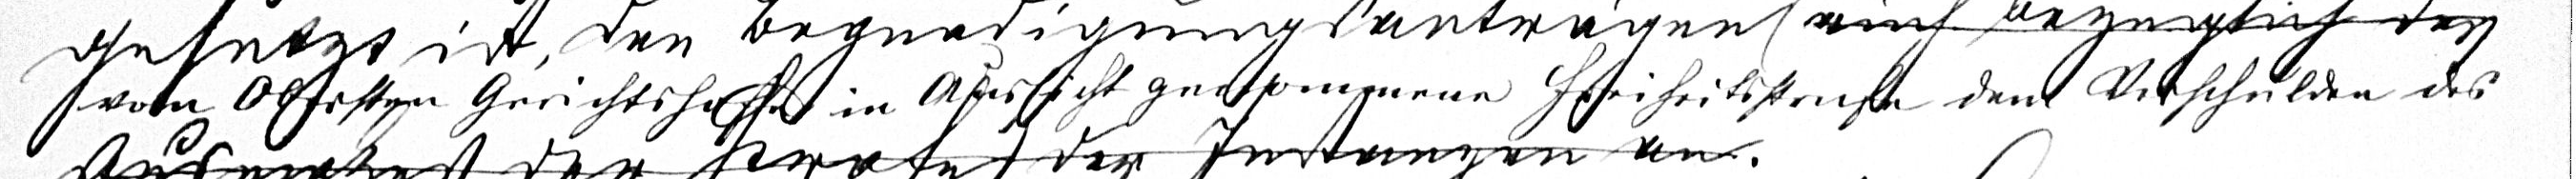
vom Obersten Gerichtshof in Aussicht genommene Freiheitsstrafe dem Verschulden des
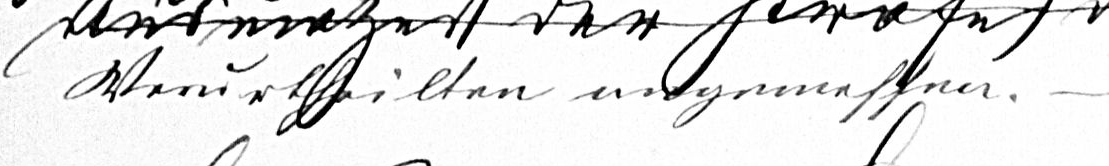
Verurtheilten angemessen. —
